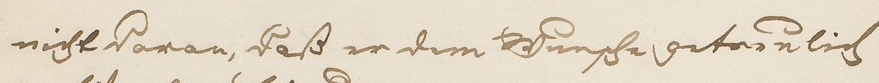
nich daran, daß er dem Wunsche getreulich
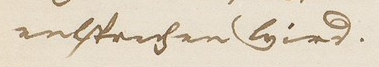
entsprechen wird.
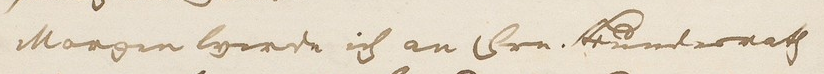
Morgen werde ich an Hrn. Bundesrath
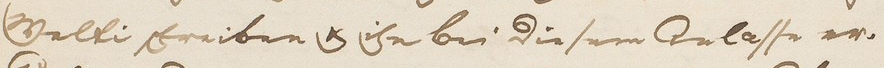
Welti schreiben & ihn bei diesem Anlasse er-
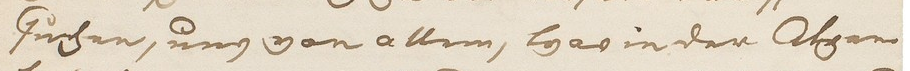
suchen, uns von allem, was in der Alpen -
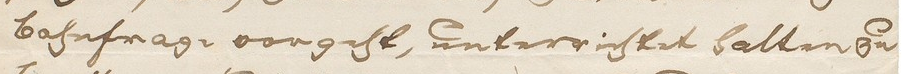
bahnfrage vorgeht, unterrichthet halten zu
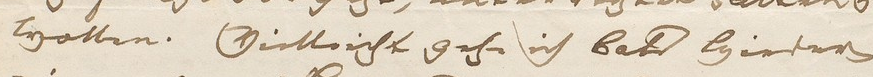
wollen. Vielleicht gehe ich bald wieder
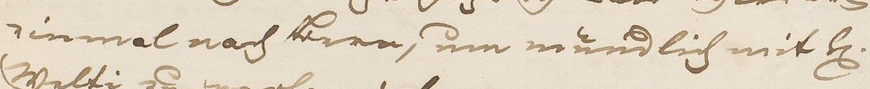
einmal nach Bern, um mündlich mit Hr.
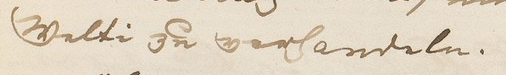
Welti zu verhandeln.
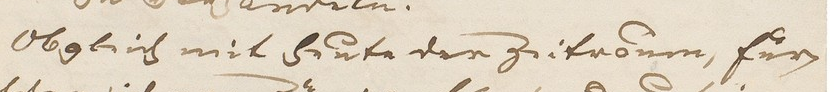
Obgleich mit heute der Zeitraum, für
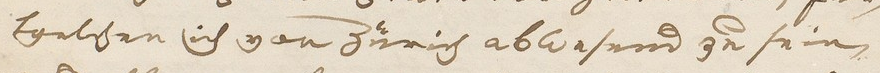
welchen ich von Zürich abwesend zu sein
